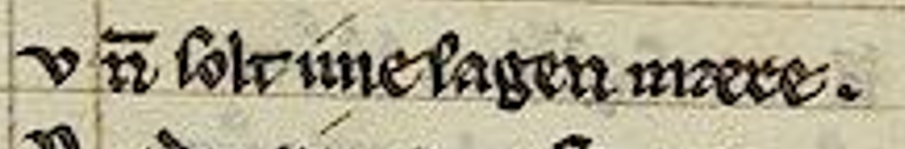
Vn(d) ſolt ime ſagen m[ae]re.
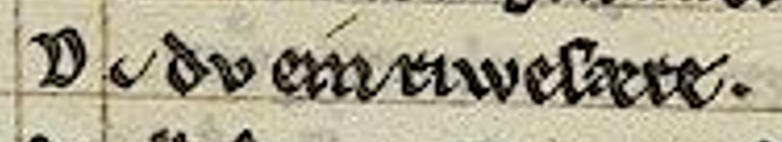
D(az) dv ein riweſ[ae]re.
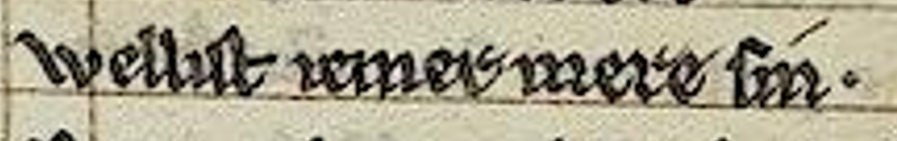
Welliſt iemer mere ſin.
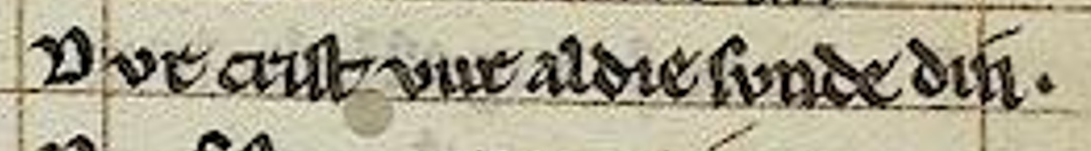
Dvr criſt vur aldie ſvnde din.
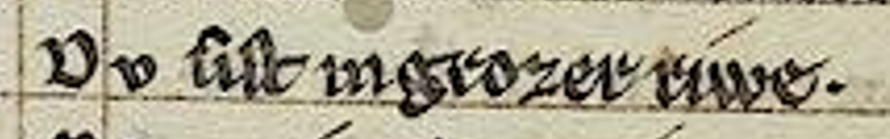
Dv ſiſt in grozer riwe.
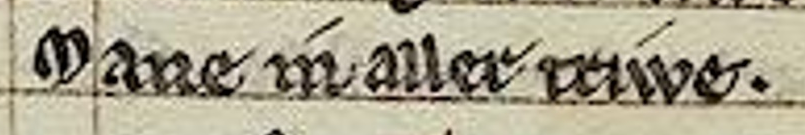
Mane in aller triwe.
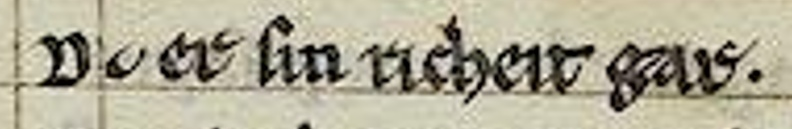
D(az) er ſin richeit gar.
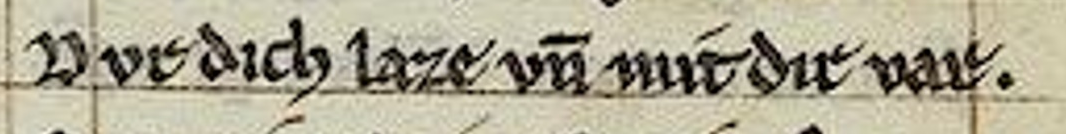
Dvr dich laze vn(d) mit dir var.
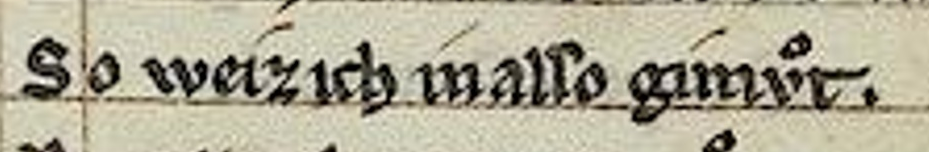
So weiz ich in alſo gimv°ot.
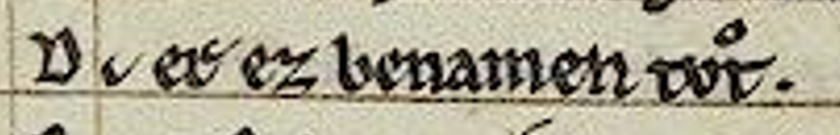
D(az) er ez benamen tv°ot.
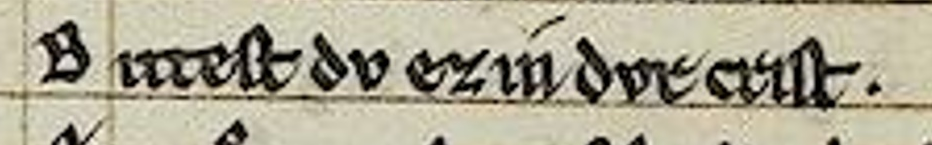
Bitteſt dv ez in dvr criſt.
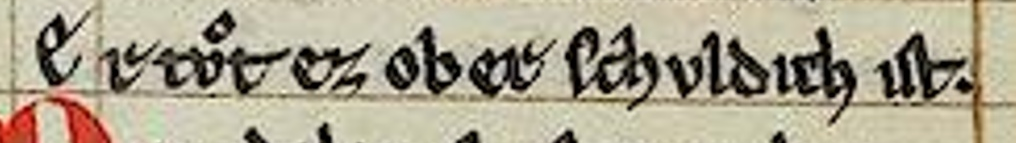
Er tv°ot ez ob er ſchvldich iſt.
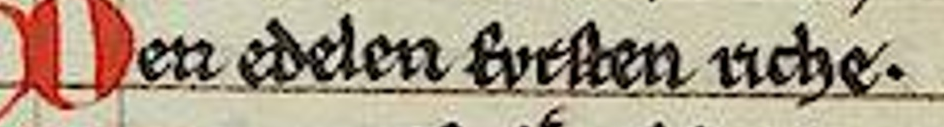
*Den edelen fvrſten riche.
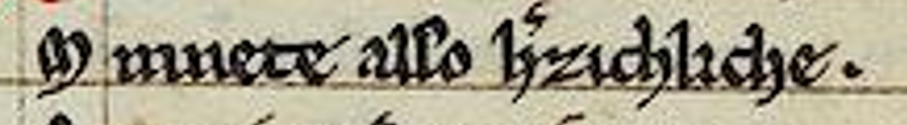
Minnete alſo h(er)zichliche.
